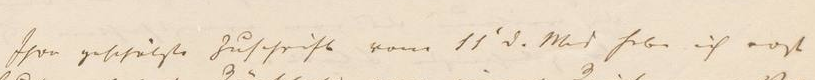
Ihre geschätzte Zuschrift vom 11t d. Mts habe ich erst
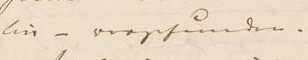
lin – vorgefunden.
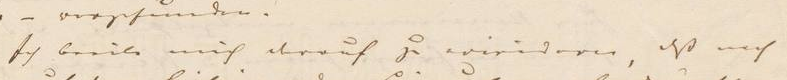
Ich beeile mich darauf zu erwidern, daß nach
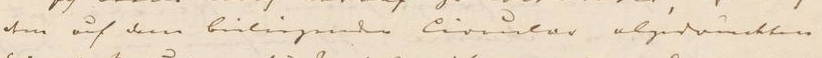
dem auf dem beiliegenden Circular abgedruckten
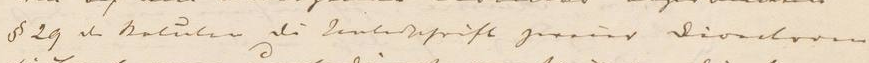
§ 29 der Statuten die Unterschrift zweier Directoren
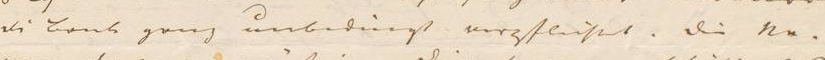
die Bank ganz unbedingt verpflichtet. Die Na-
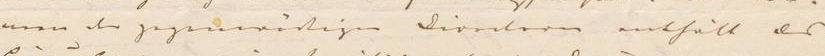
men der gegenwärtigen Directoren enthält das
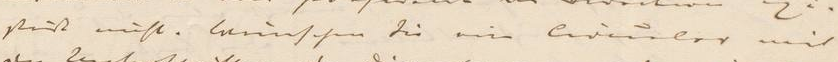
stirt nicht. Wünschen Sie ein Circular mit
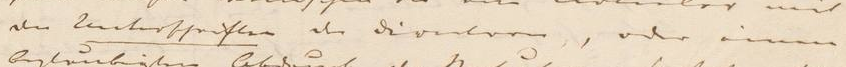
den Unterschriften der Directoren, oder einen
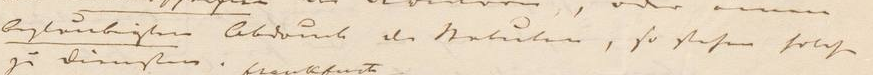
beglaubigten Abdruck der Statuten, so stehen solche
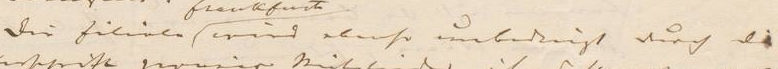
Die Filiale Frankfurt wird ebenso unbedingt durch die
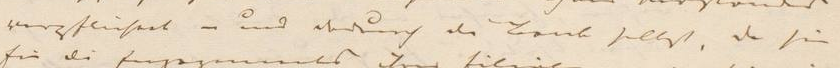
verpflichtet – und dadurch die Bank selbst, da sie
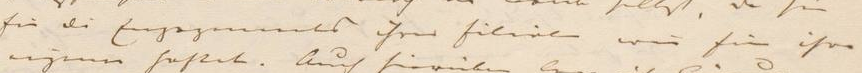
für die Engagements ihrer Filialen wie für ihre
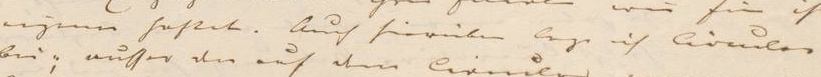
eigenen haftet. Auch hierüber lege ich Circular
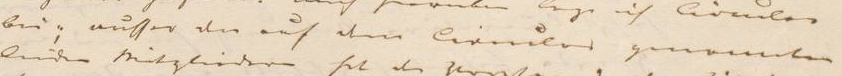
bei; ausser den auf dem Circular genannten
